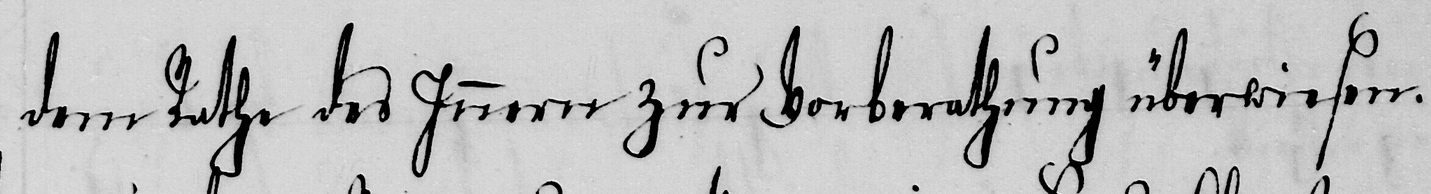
dem Rathe des Innern zur Vorberathung überwiesen.
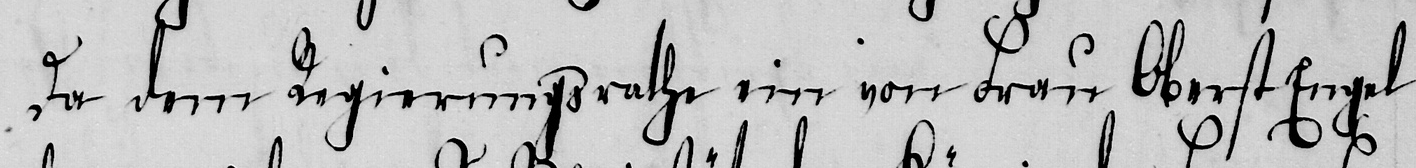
Da dem Regierungsrathe ein von Frau Oberst Engel
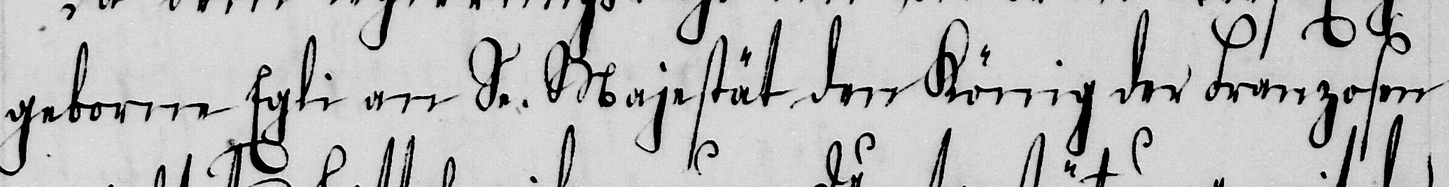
geborene Egli an Se. Majestät den König der Franzosen
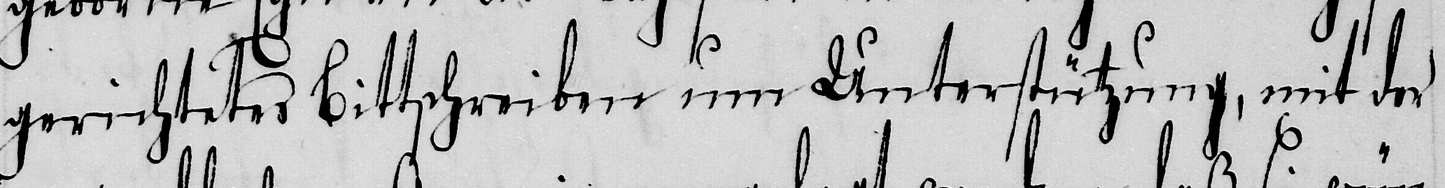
gerichtetes Bittschreiben um Unterstützung, mit der
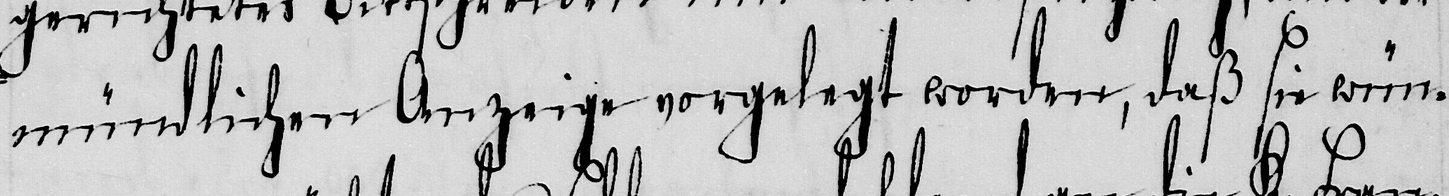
mündlichen Anzeige vorgelegt worden, daß sie wün¬
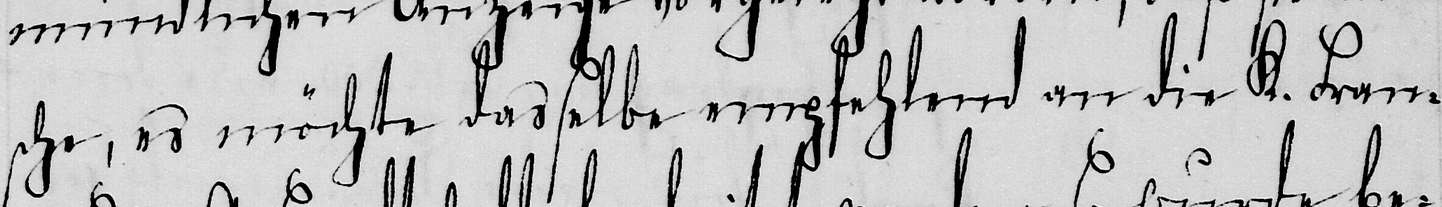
sche, es möchte dasselbe empfehlend an die K. Fran¬
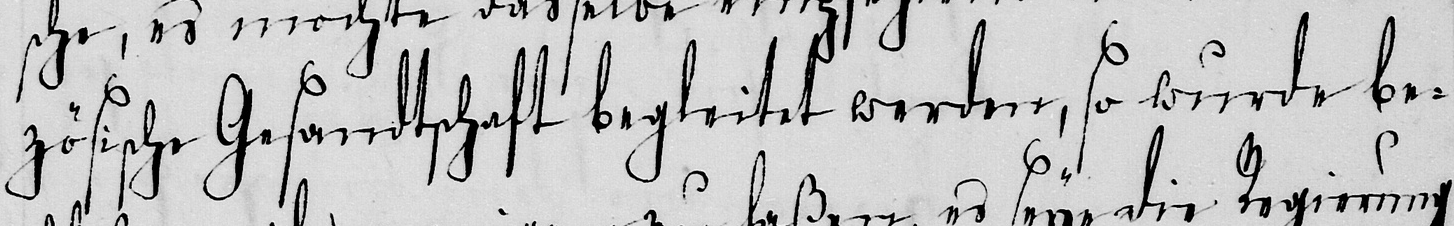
zösische Gesandtschaft begleitet werden, so wurde be¬
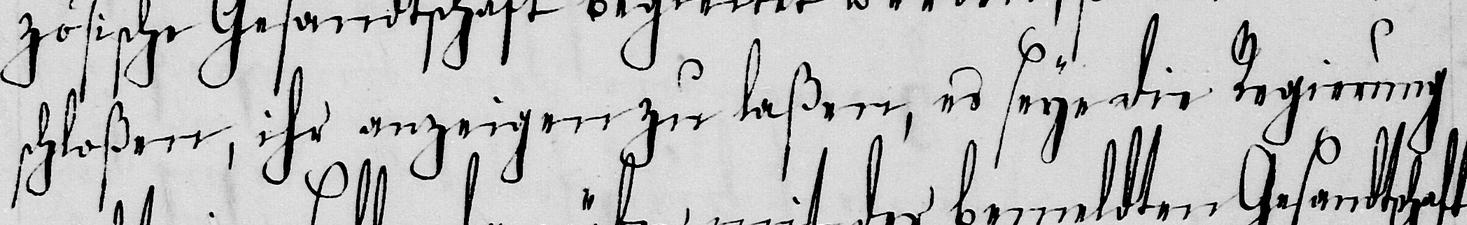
schloßen, ihr anzeigen zu laßen, es seye die Regierung
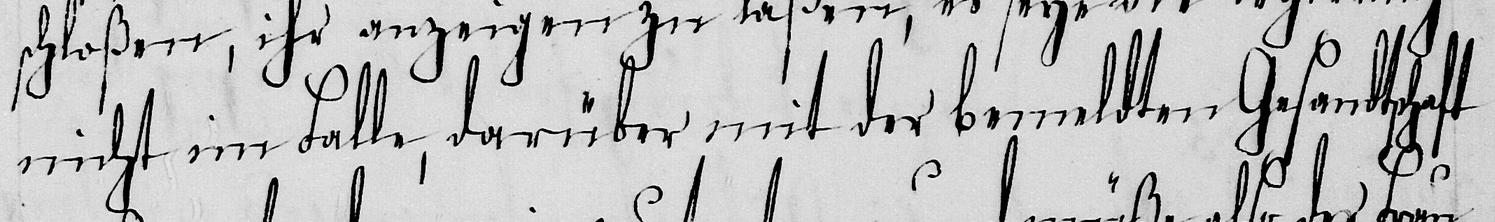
nicht im Falle, darüber mit der bemeldten Gesandtsch¬
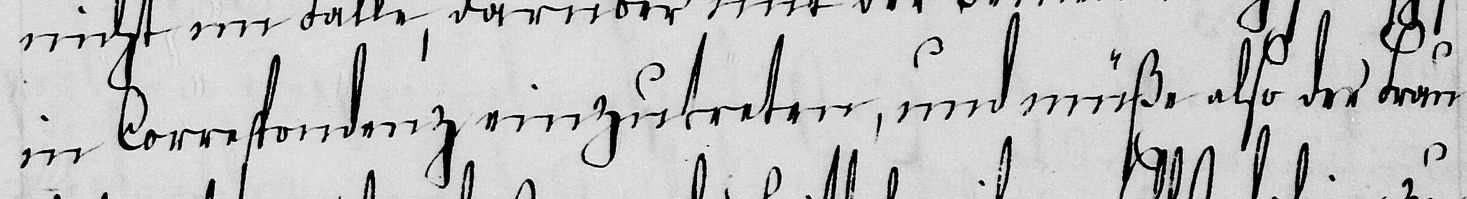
in Correspondenz einzutreten, und müße also der Frau
